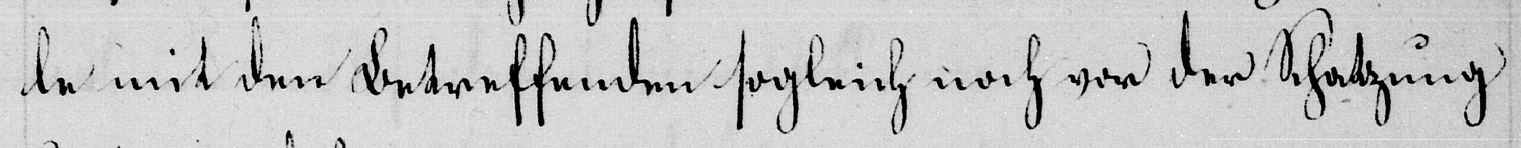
le mit dem Betreffenden sogleich noch vor der Schatzung
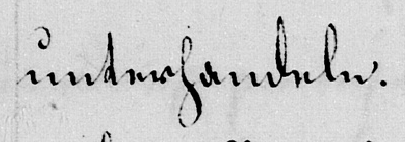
unterhandeln.
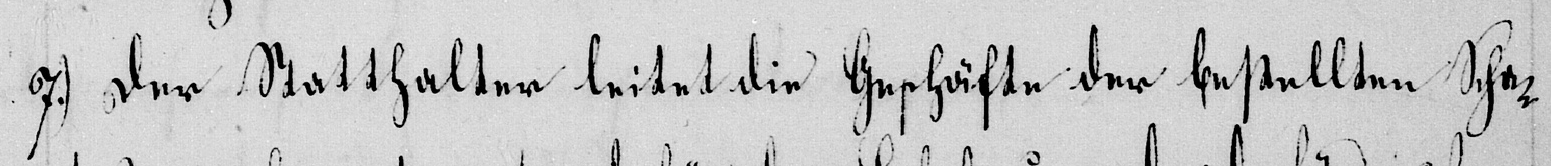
7.) Der Statthalter leitet die Geschäfte der bestellten Scha¬
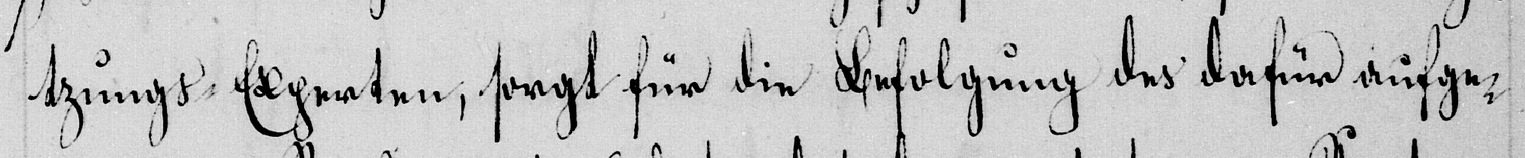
tzungs-Experten, sorgt für die Befolgung des dafür aufge¬
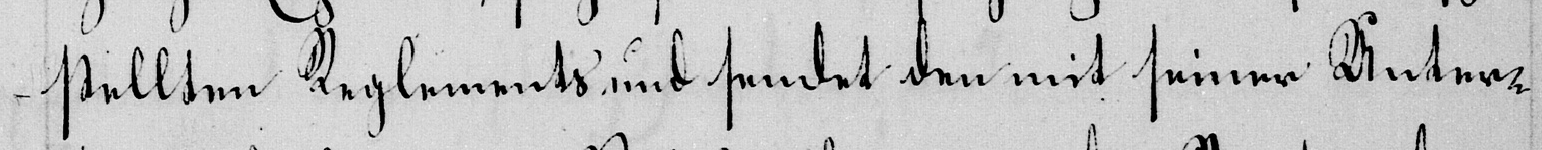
stellten Reglements und sendet den mit seiner Unter¬
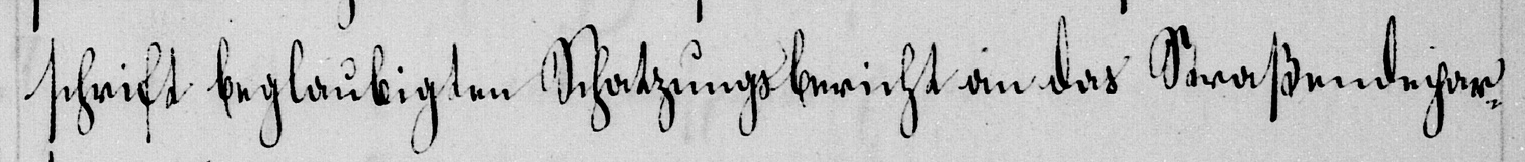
schrift beglaubigten Schatzungsbericht an das Straßendepar¬
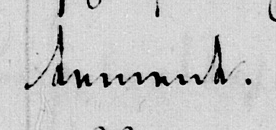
tement.
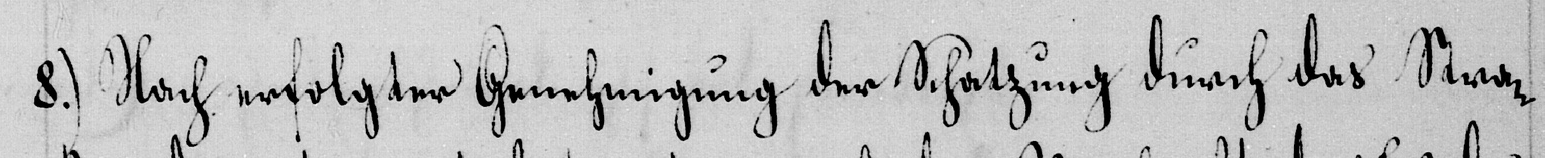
8.) Nach erfolgter Genehmigung der Schatzung durch das Stra¬
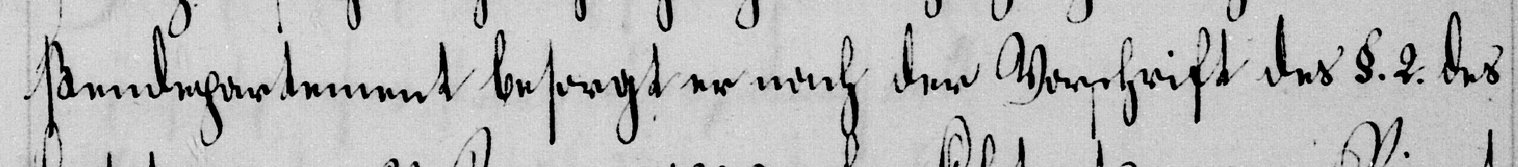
ßendepartement besorgt er nach der Vorschrift des §. 2. des
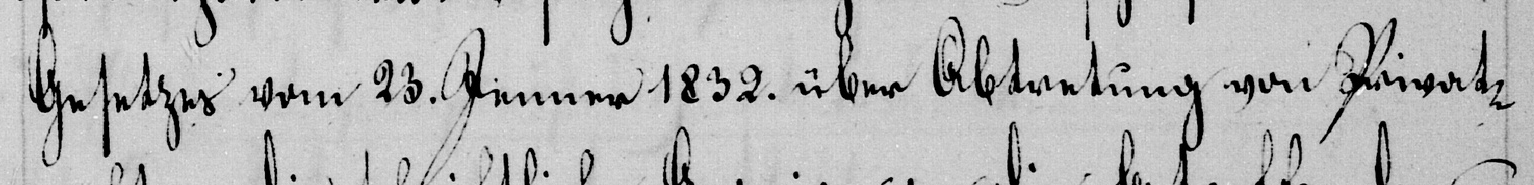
Gesetzes von 23. Jenner 1832. über Abtretung von Privat¬
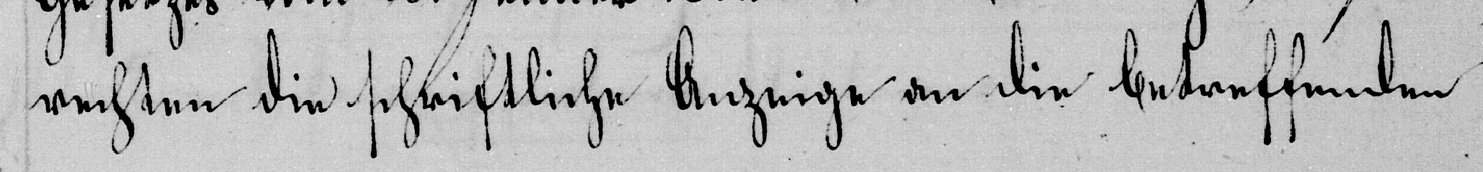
rechten die schriftliche Anzeige an die betreffenden
